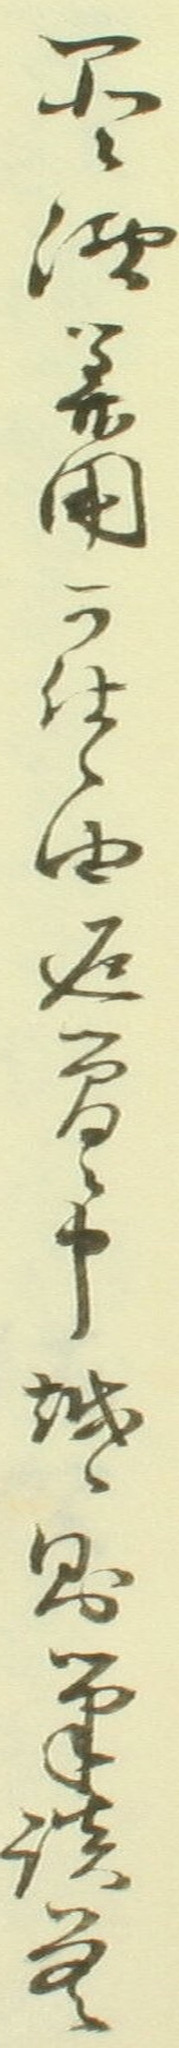品々価算用可仕候由返簡に申越候則筆談差
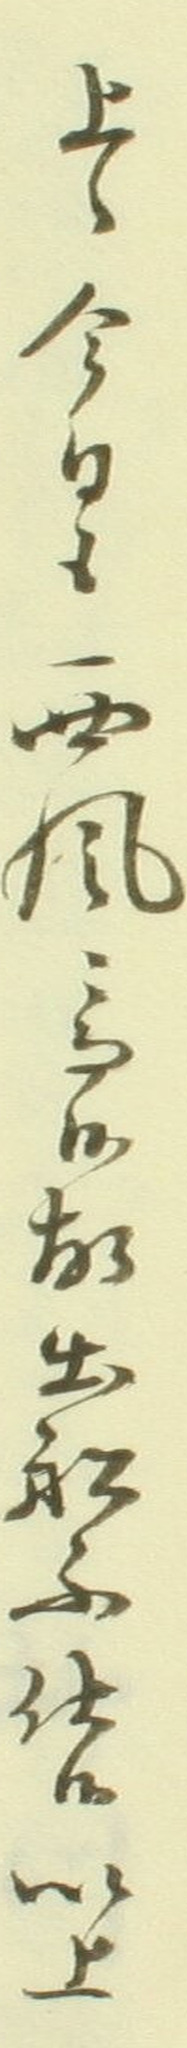上候今日も西風に而候故出船不仕候以上
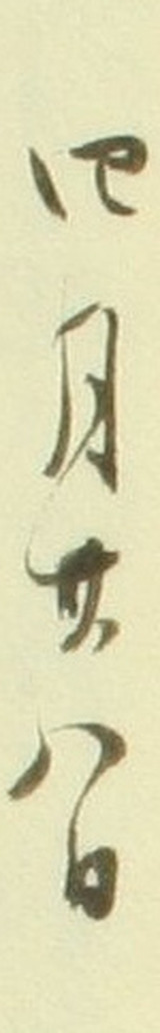四月廿八日
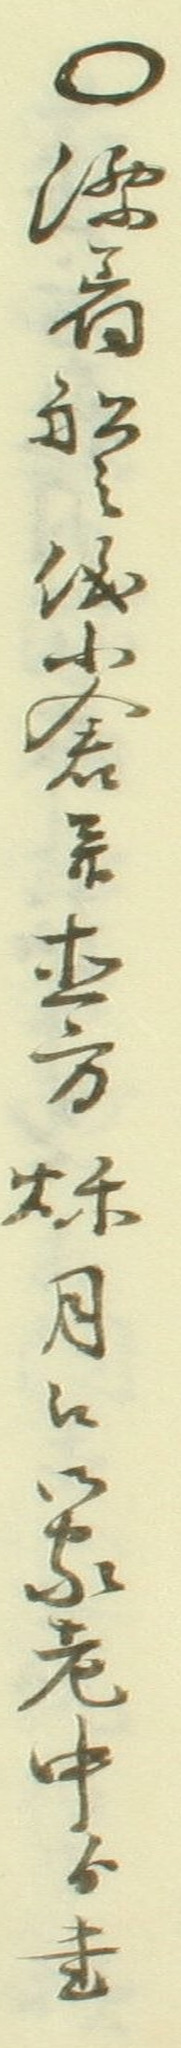〇漂着船之儀小倉并直方秋月え御家老ゟ書
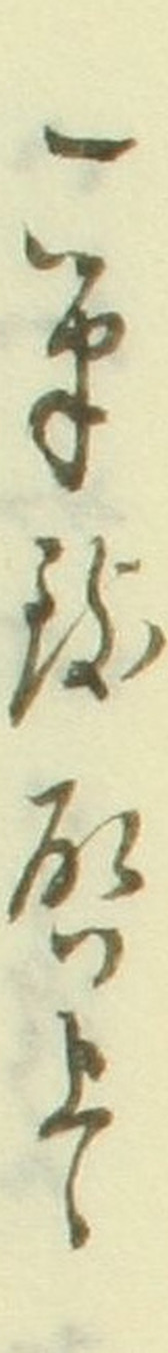一筆致啓上候
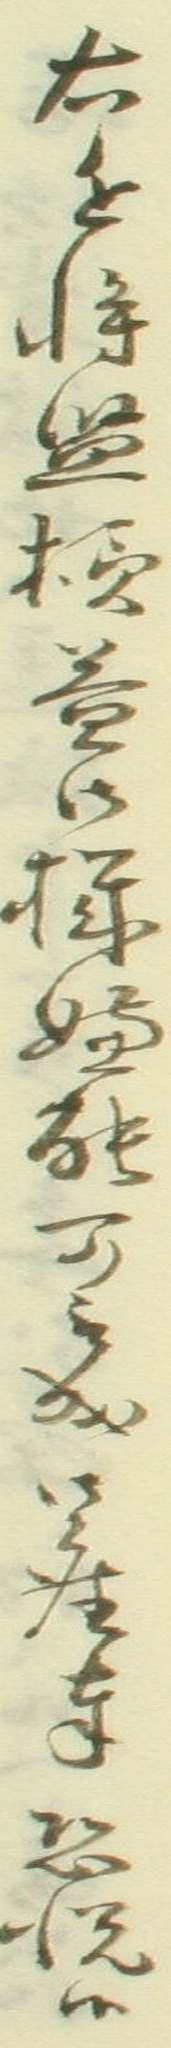右近将監様益御機嫌能可被成御座奉恐悦候
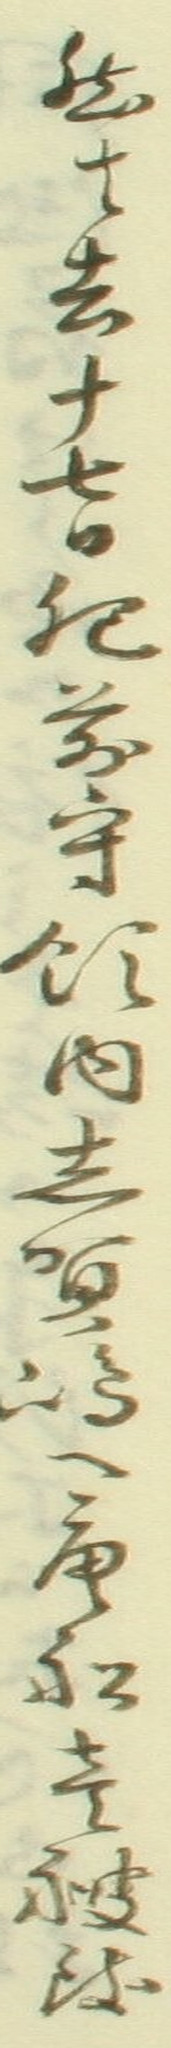然は去十七日肥前守領内志賀島へ唐船壱艘致
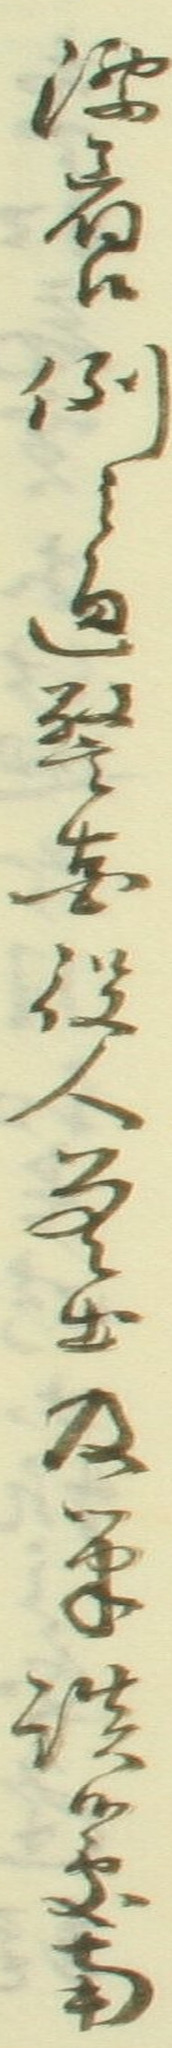漂着候例之通警固役人差出及筆談候処南

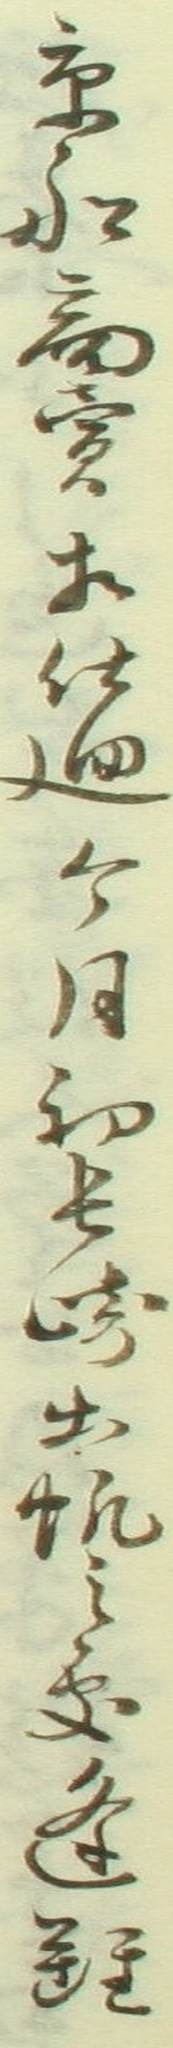京船商相仕廻今月初長崎出帆之処逢離
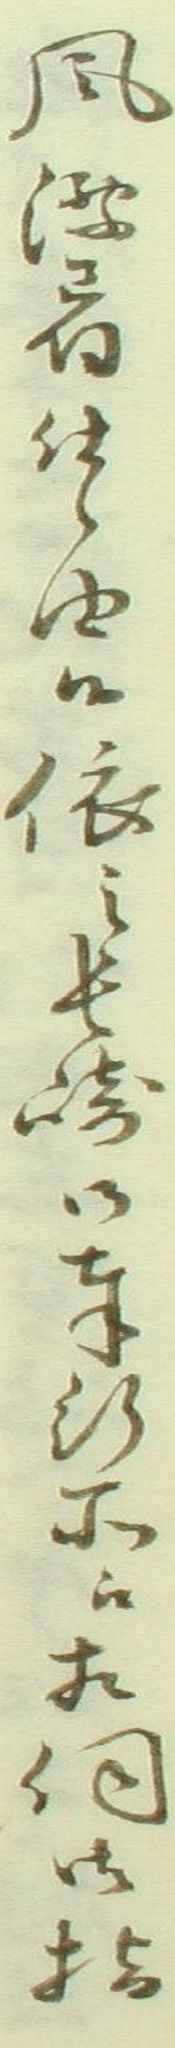風漂着仕候由候依之長崎御奉行所え相伺御指
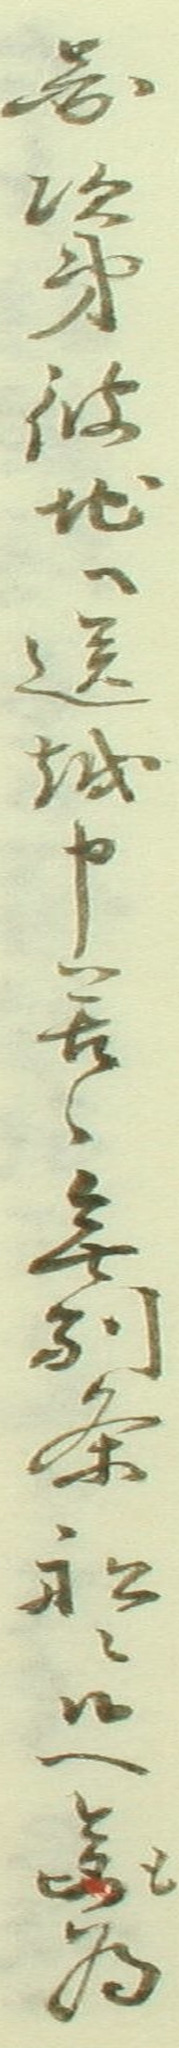図次第彼地へ送越申筈候無別条船に候へとも為
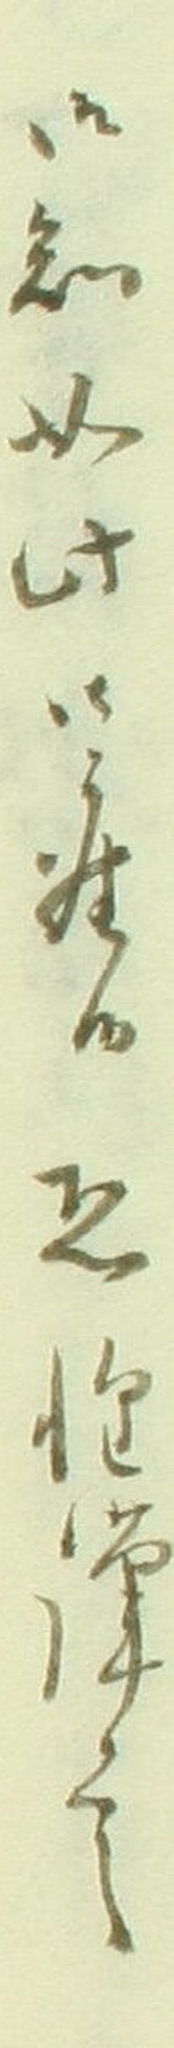御知如此御座候恐惶謹言
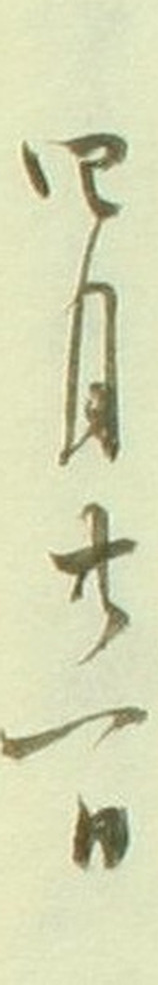四月廿一日
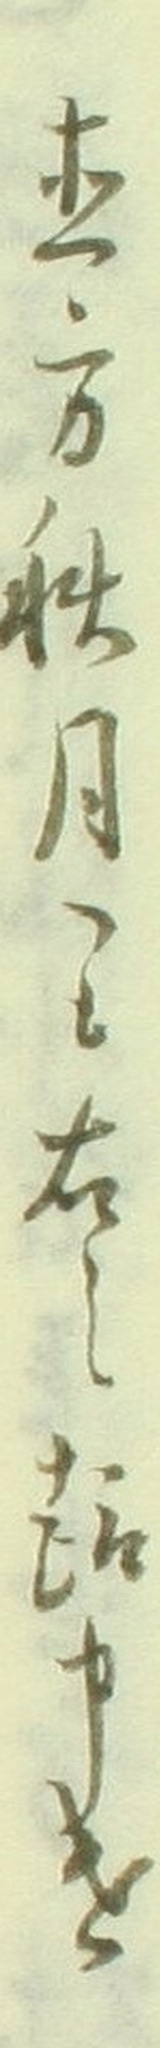直方秋月へも右之趣申遣
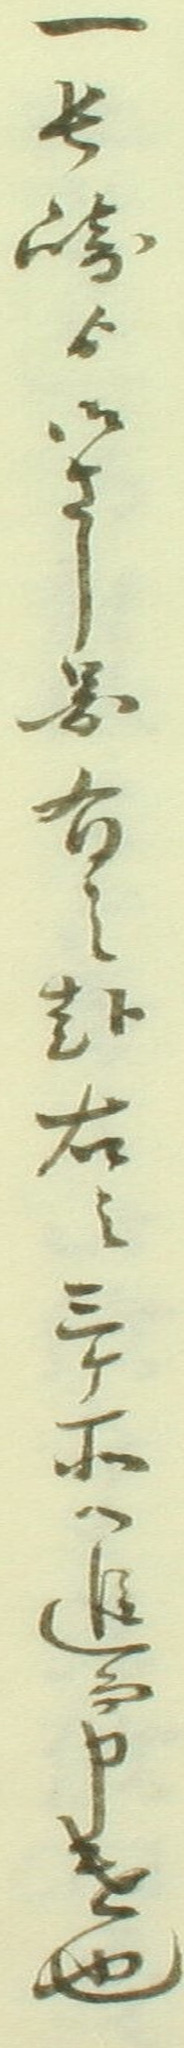一長崎ゟ御さし図有之赴右之三ヶ所へ追而申遣也
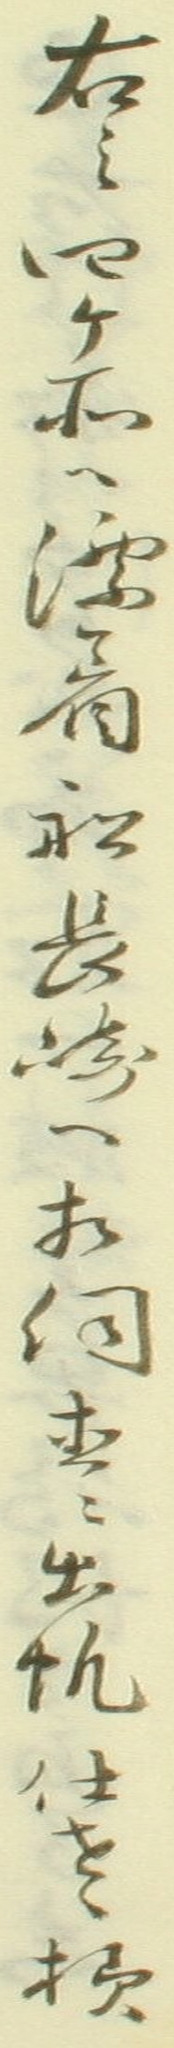右之四ヶ所へ漂着船長崎へ相伺直に出帆仕せ候様
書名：異国船漂着記
